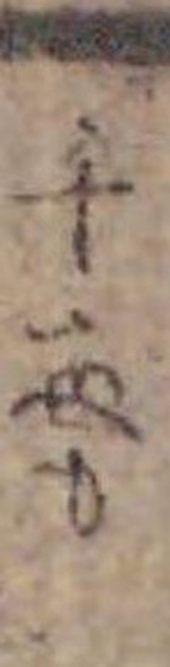千両も
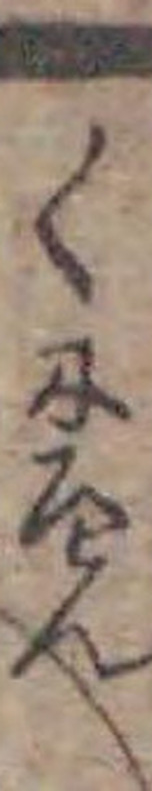〳〵なへん
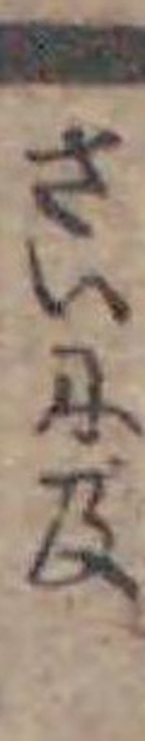さいに及
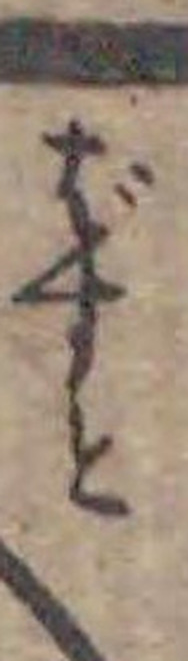ばずと
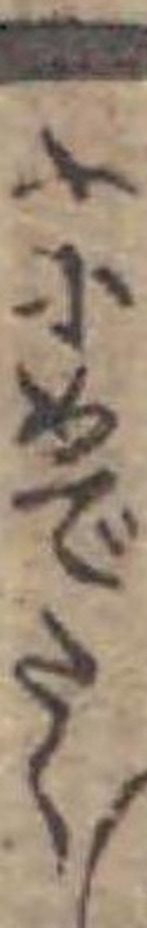ふ？にめでたく
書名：蛭子大黒壮年過 : 2巻
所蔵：国立国会図書館 National Diet Library, JAPAN
